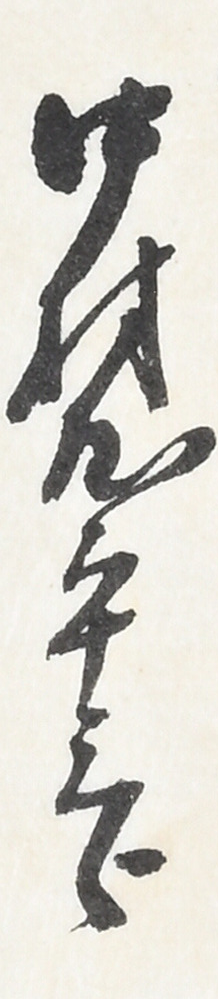一中村屋平三郎
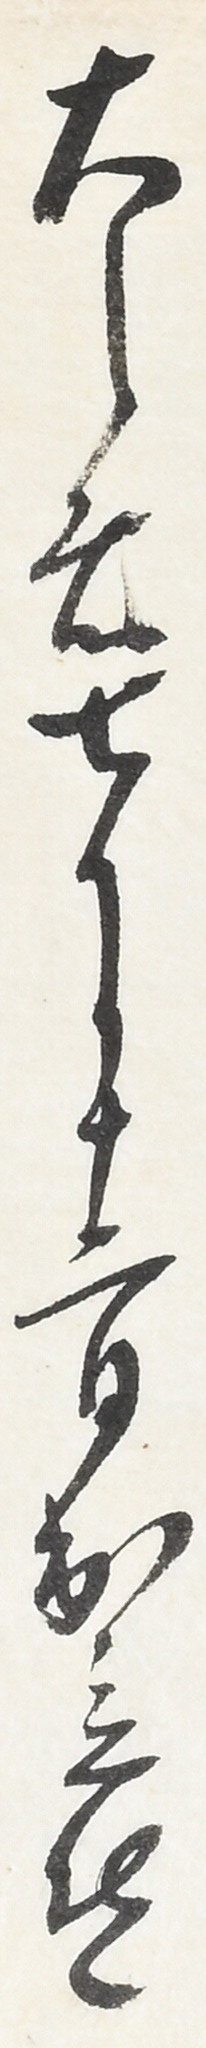右之者七月十二日出立仕候
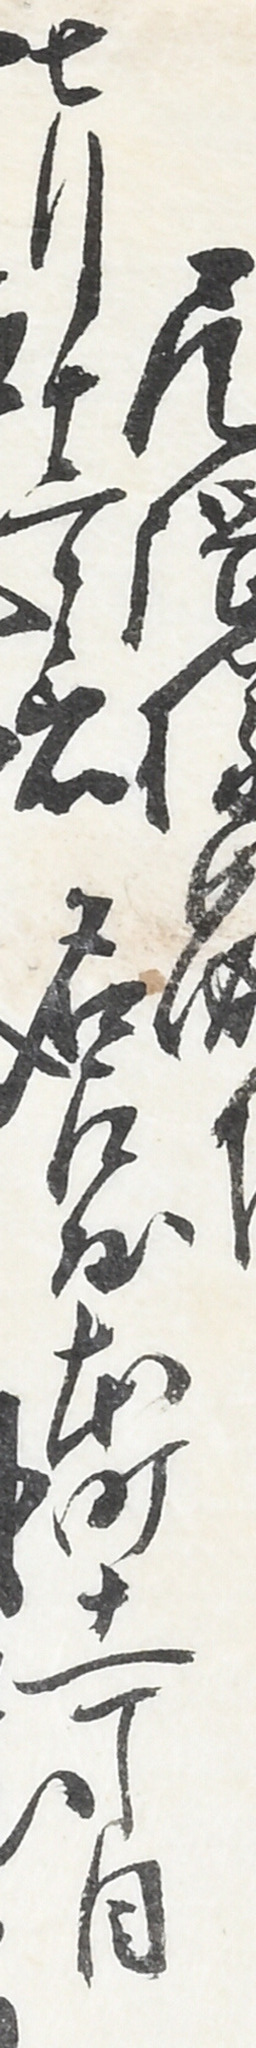七月十二日着名古屋本町十一丁目
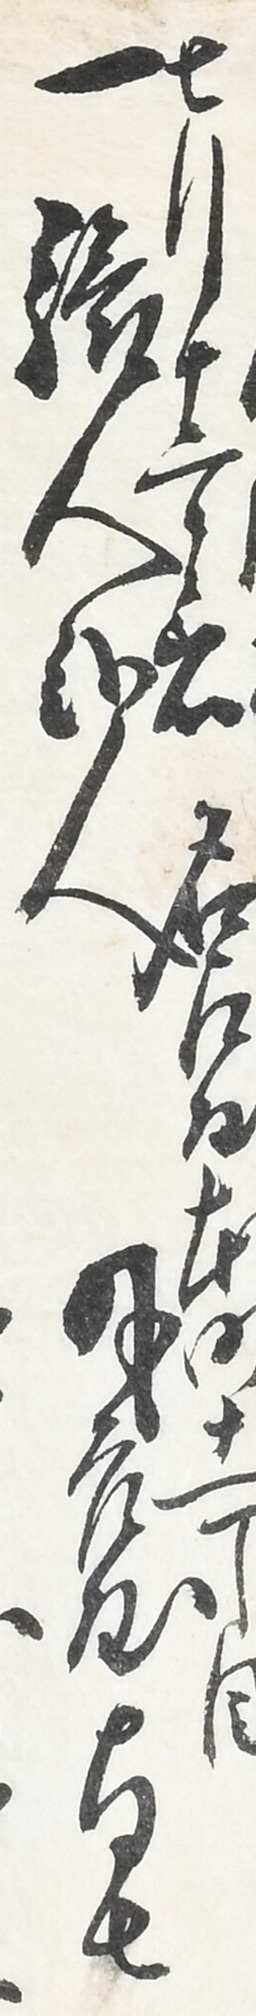一旅人弐人丸吉屋与七
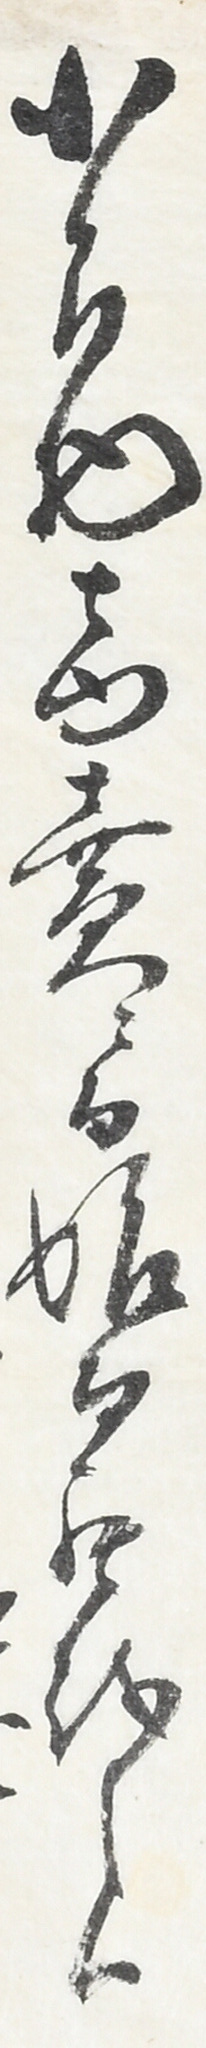小間物商売ニ而始而罷越申候
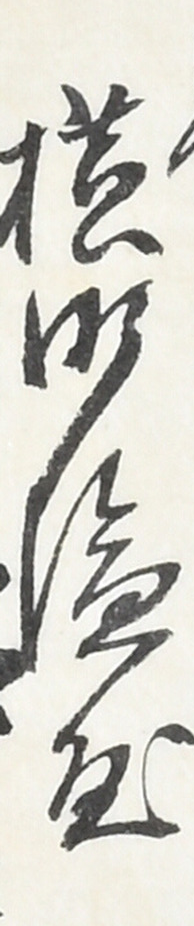横町塩屋
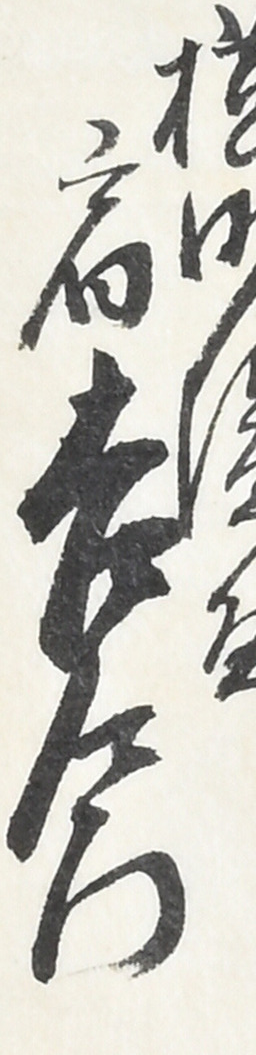宿吉左衛門
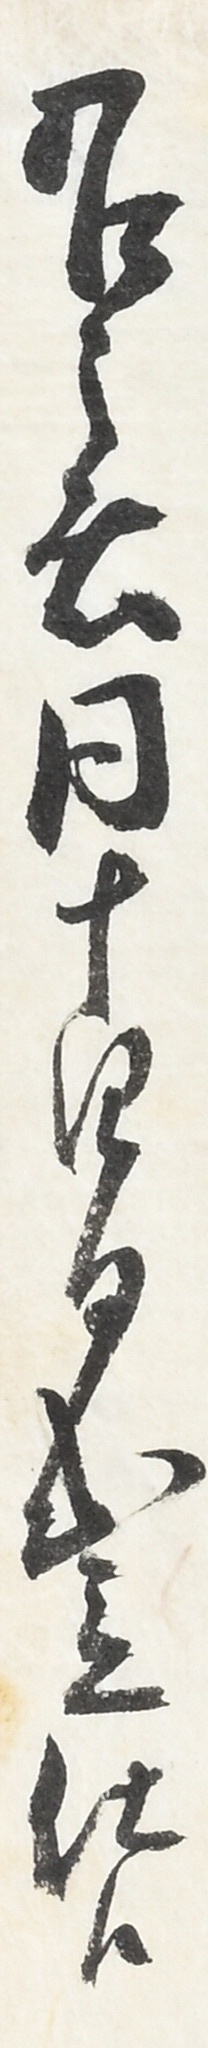右之者同十四日出立仕候

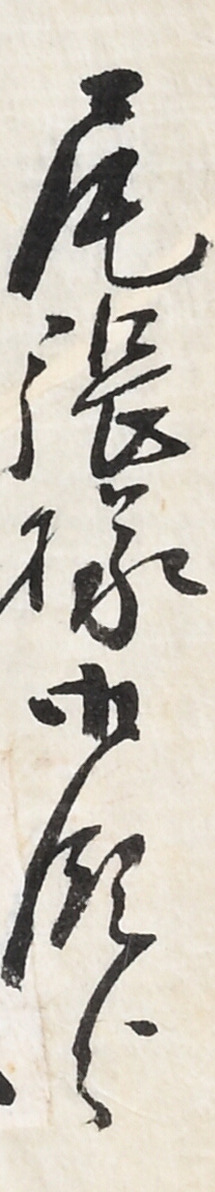尾張様御領分
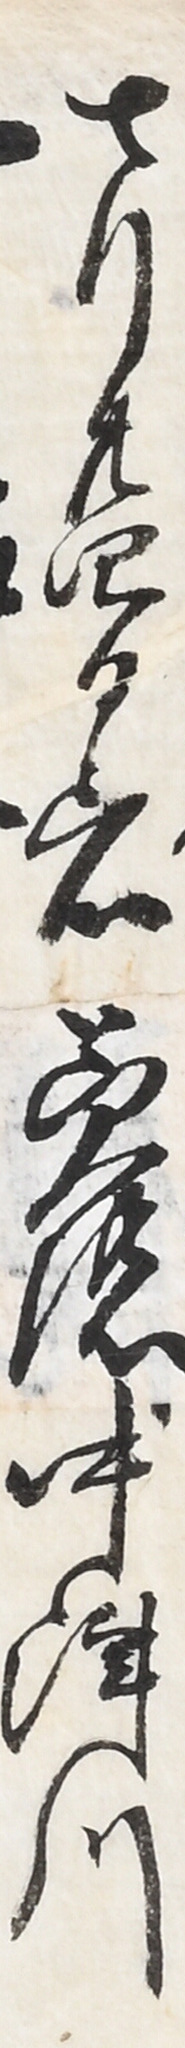七月廿四日着美濃中津川
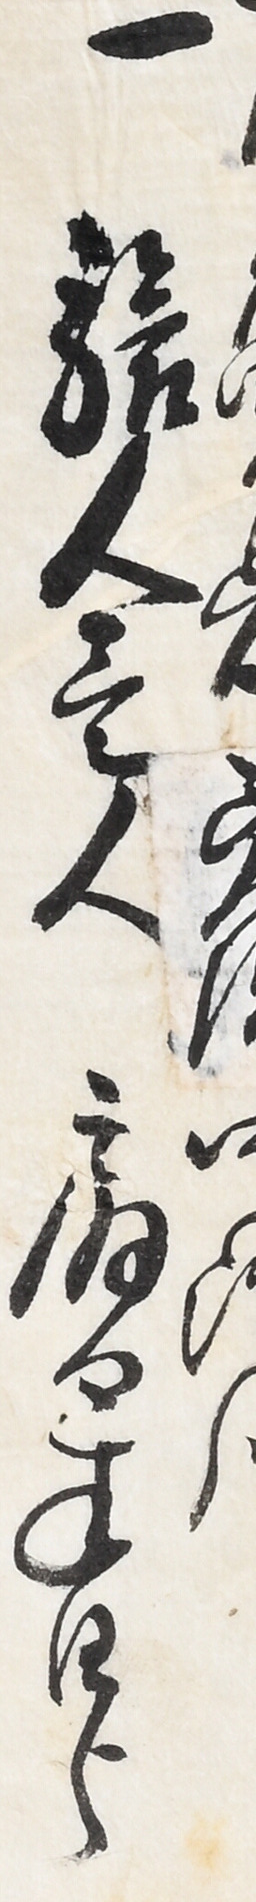一旅人壱人扇や半四郎
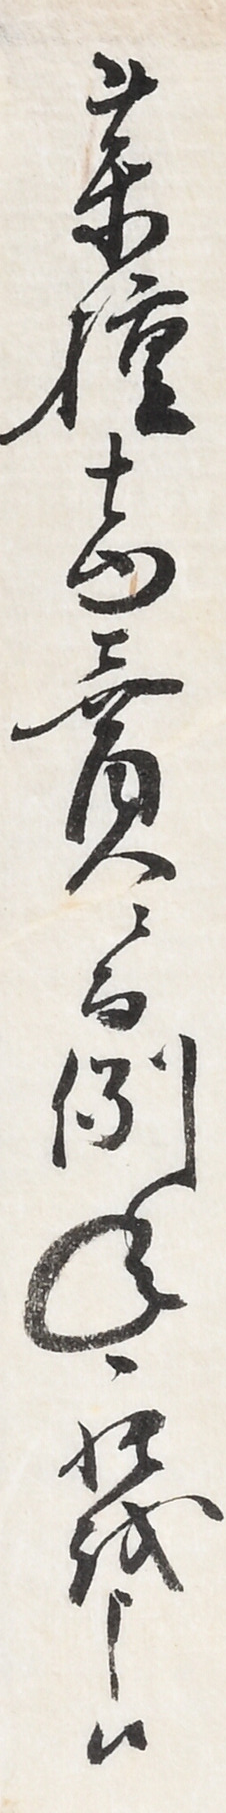薬種商売ニ而例年罷越申候
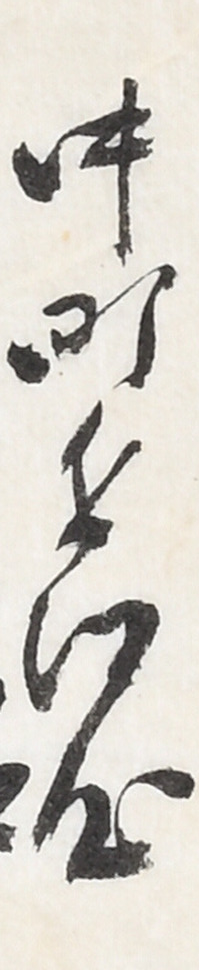中町近江屋
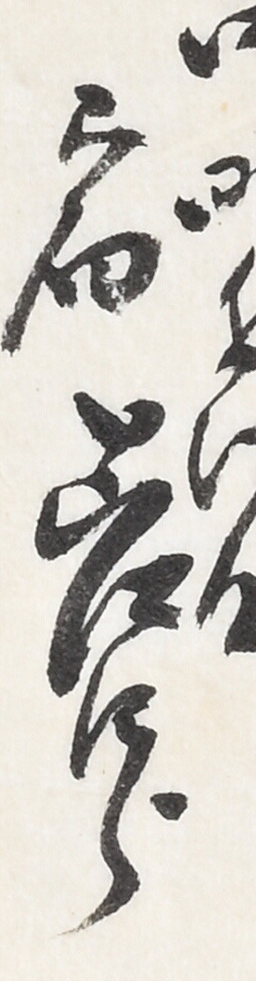宿善四郎
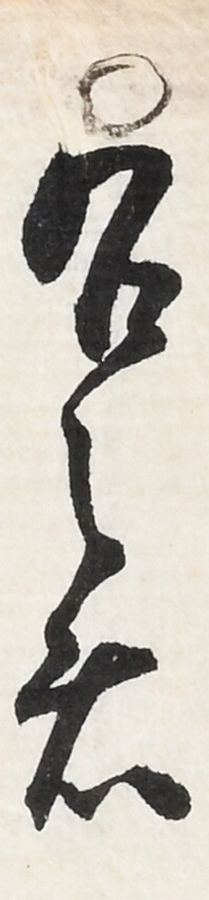右之者
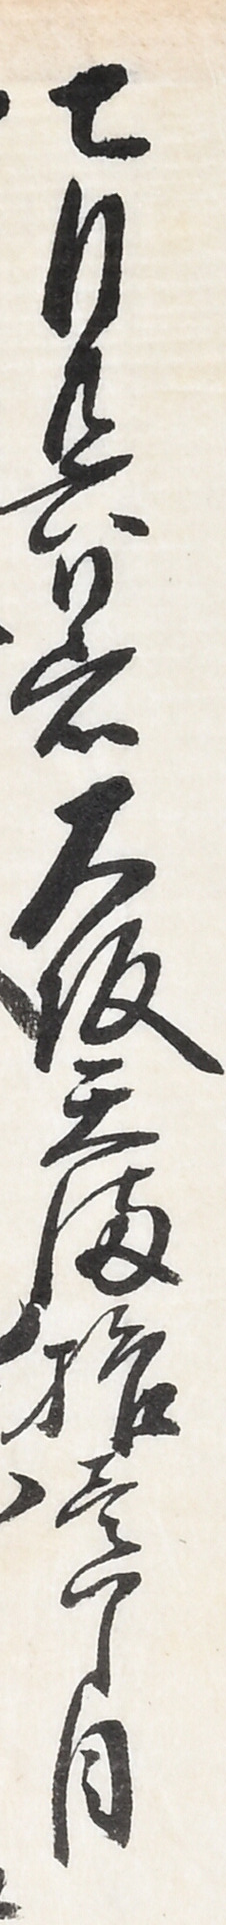七月二十六日着大坂天満橋壱丁目
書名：旅人泊控帳
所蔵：伊那市立高遠町図書館・合同会社AMANE
